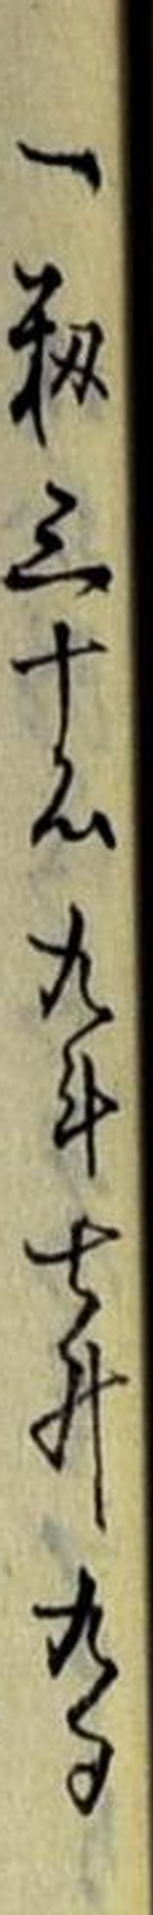一籾三十石九斗七升九勺
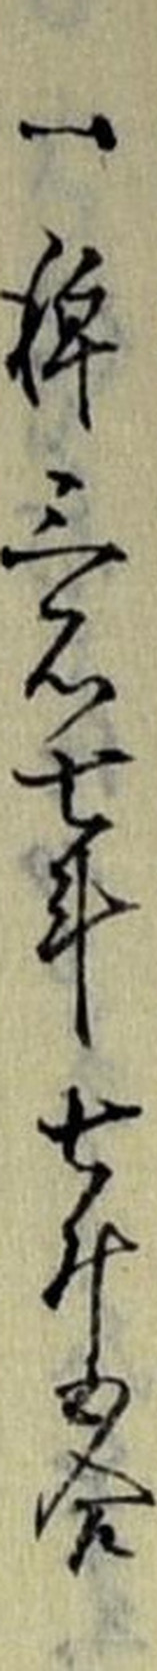一稗三石七斗七升五合
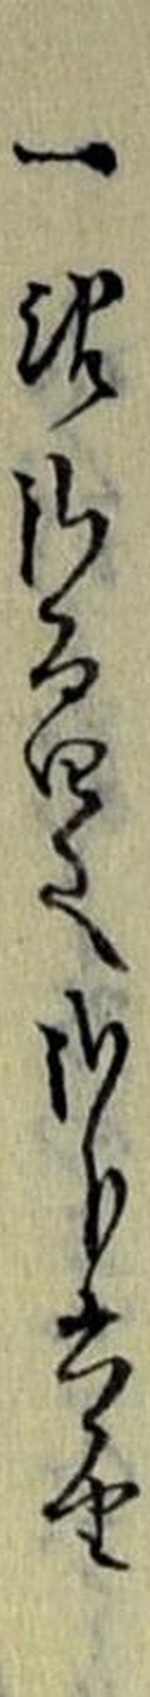一銀弐百四匁弐分六厘
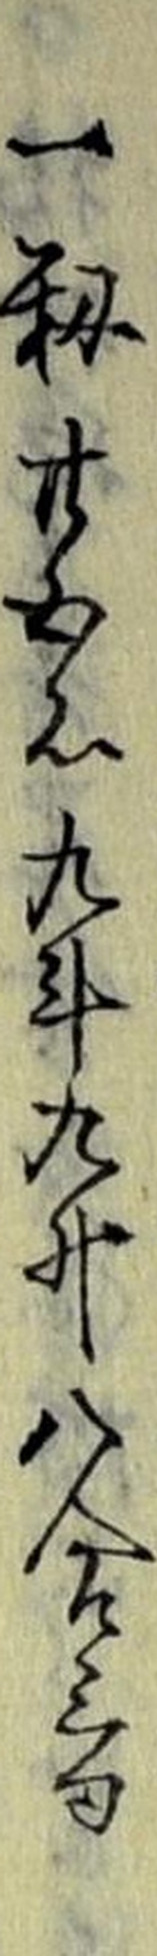一籾廿五石九斗九升八合三勺
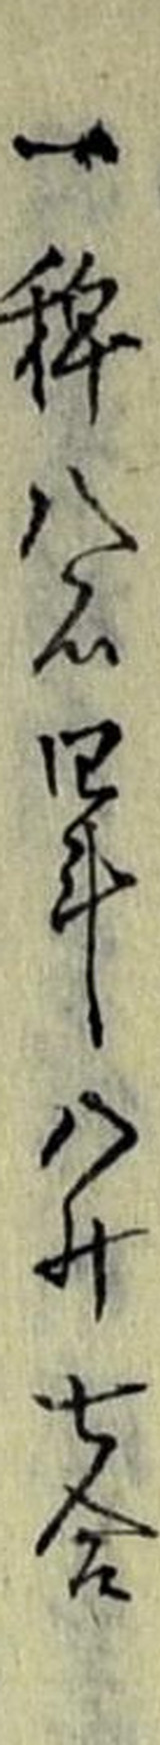一稗八石四斗八升七合
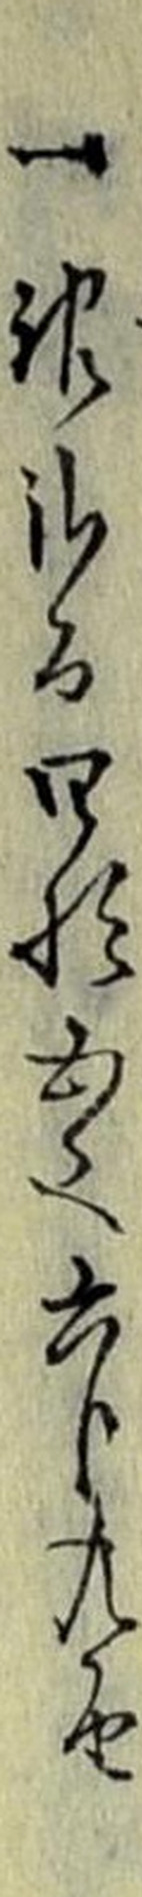一銀弐百四拾五匁六分九厘
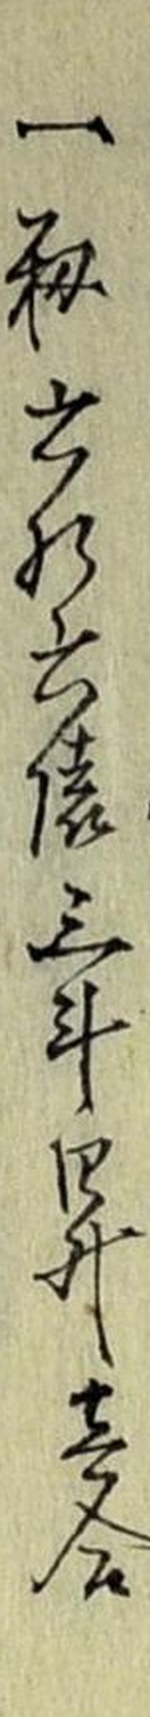一籾六拾六俵三斗四升壱合
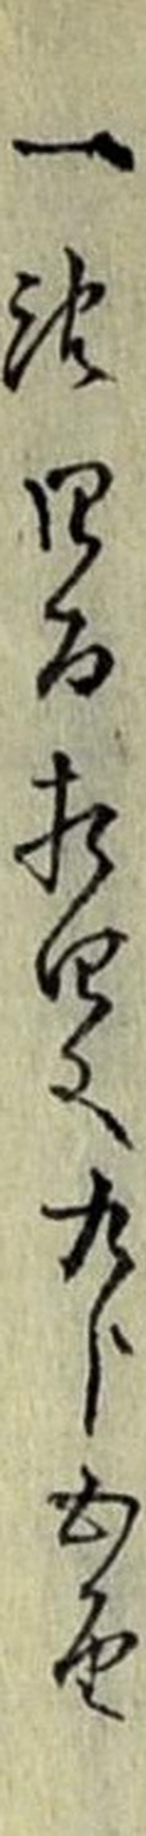一銀四百拾四匁九分五厘

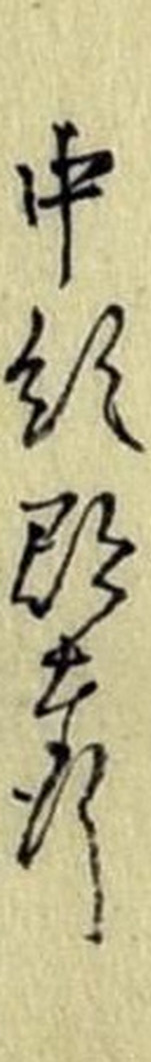中領郡奉行
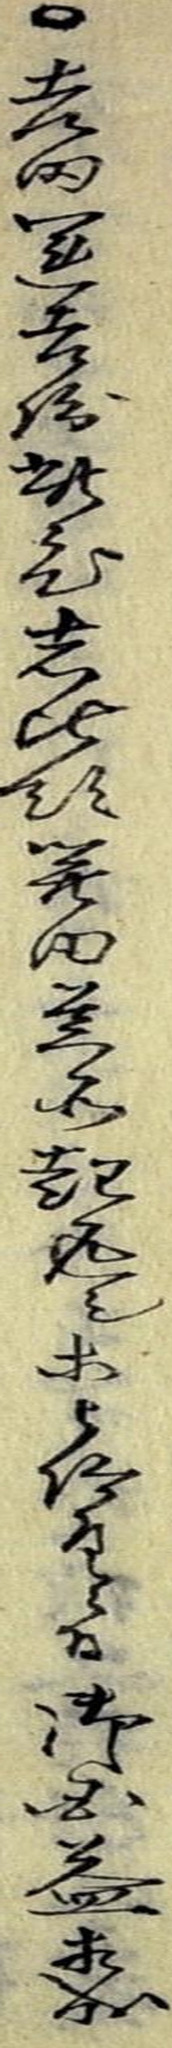○吉田運吉儀此度志比領開田荒所起返シ等被仰付候ニ付御国益相成
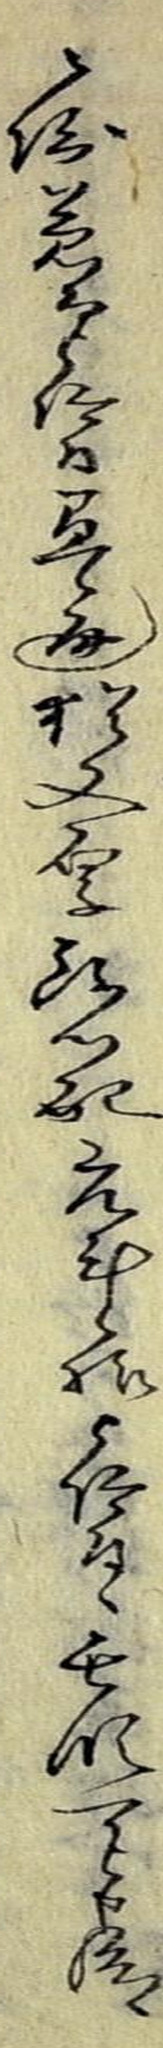ニ儀兼而被仰付置候通猶又厚致心配取計候様被仰付候其段可被申渡候
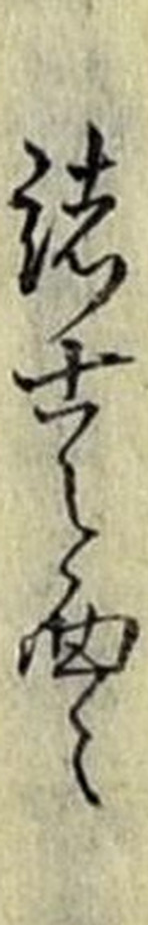諸士之面々
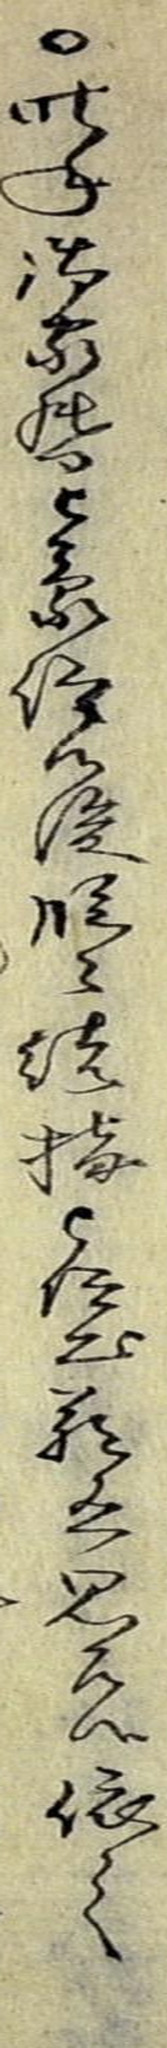○昨年御家督被蒙仰候後段々結構被仰出難有思召候依之
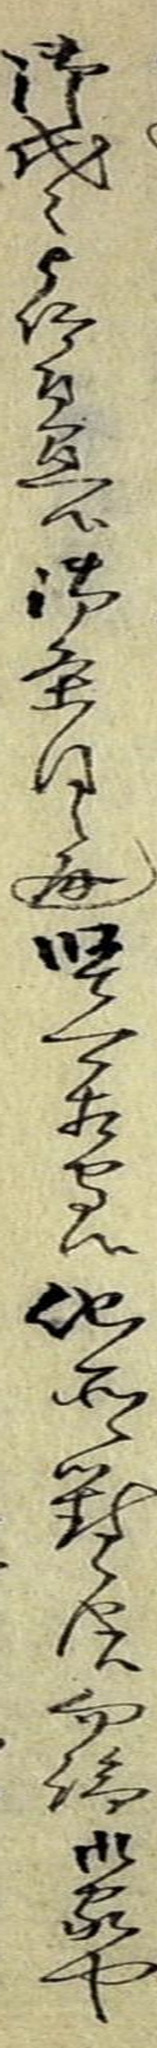御代々被仰付宜候御条目之通堅可相守候他所へ対候儀ハ勿論御家中
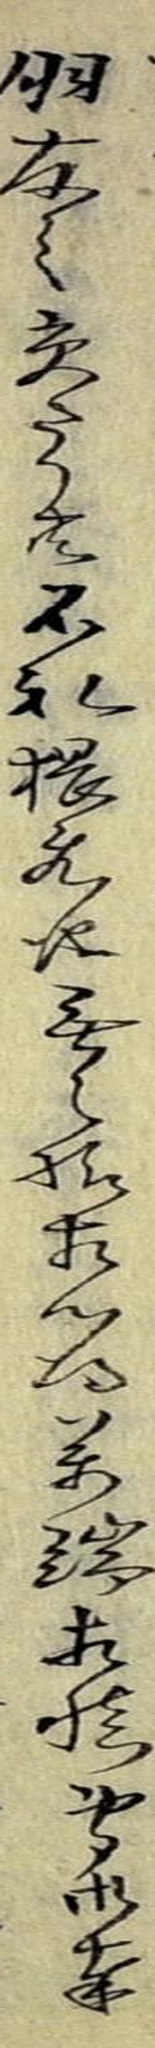朋友之交たり共不礼猥敷儀無之様相心得万端相慎専御奉
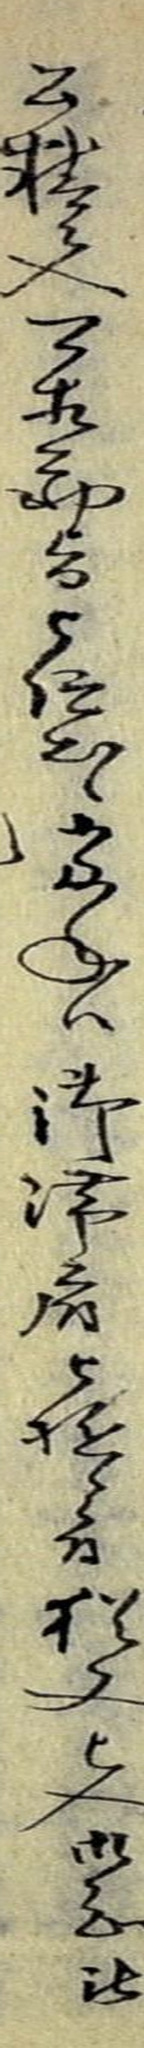公精々入可相勤旨被仰出候当年ハ御滞府被遊候ニ付猶又被入御念被
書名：命令之部 五
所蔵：福井県文書館 Fukui Prefectural Archives
